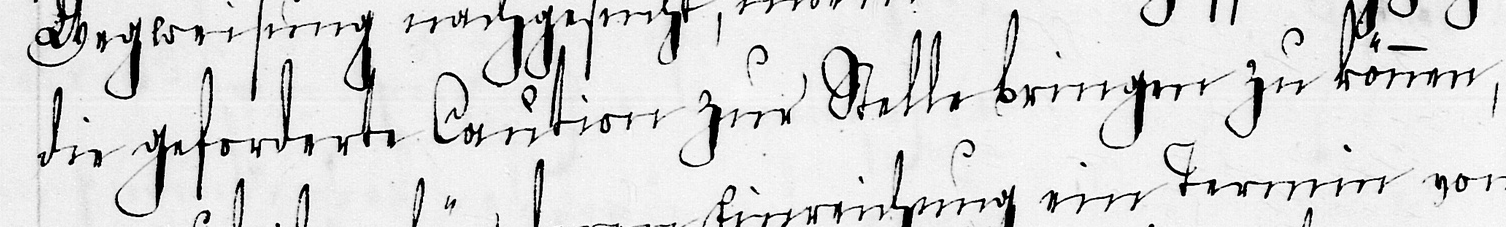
die geforderte Caution zur Stelle bringen zu können,
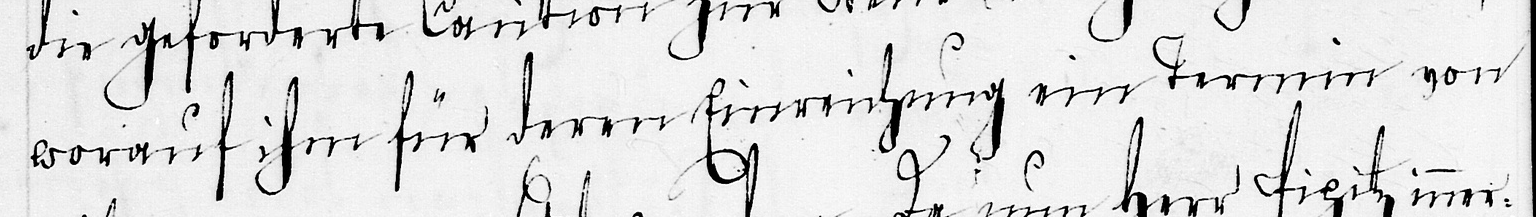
worauf ihm für deren Einreichung ein Termin von
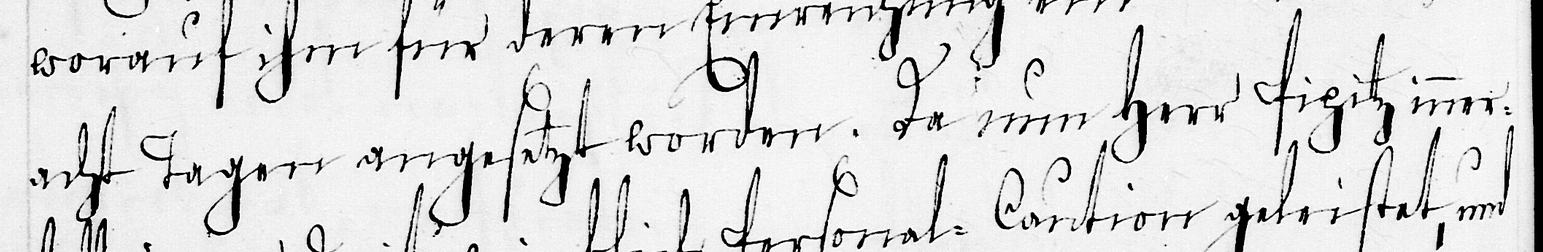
acht Tagen angesetzt worden. Da nun Herr Pipitz inne¬
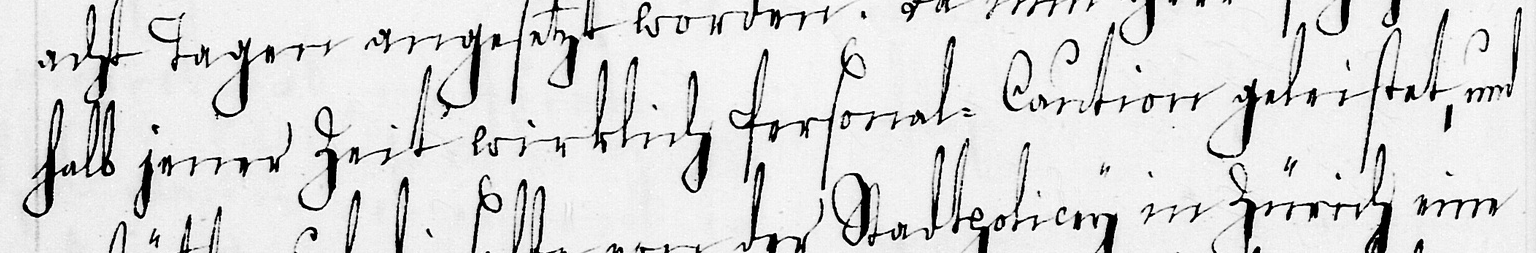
rhalb jener Zeit wirklich Personal-Caution geleistet, und
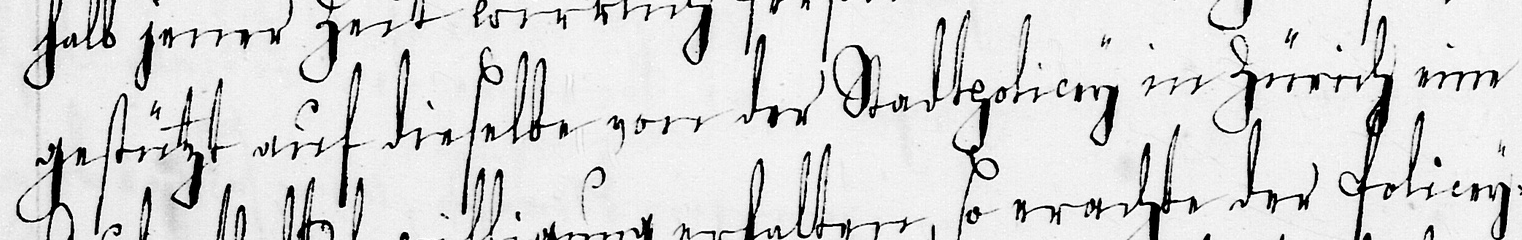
gestützt auf dieselbe von der Stadtpolicey in Zürich eine
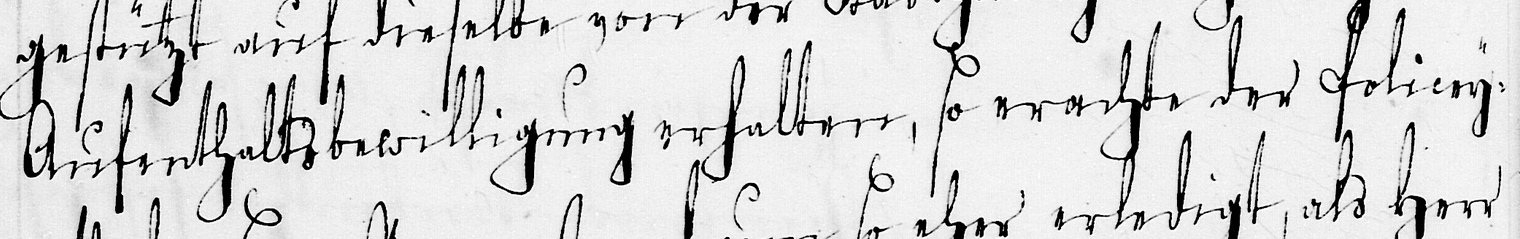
Aufenthaltsbewilligung erhalten, so erachte der Policey¬
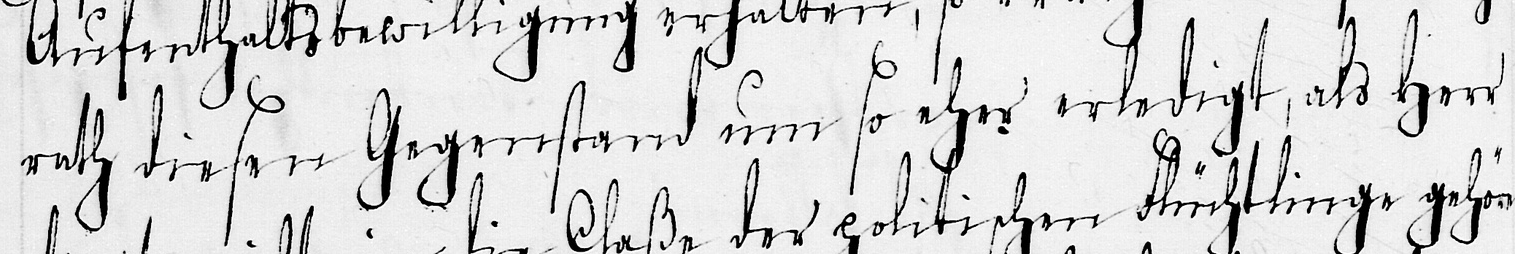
rath diesen Gegenstand um so eher erledigt, als Herr
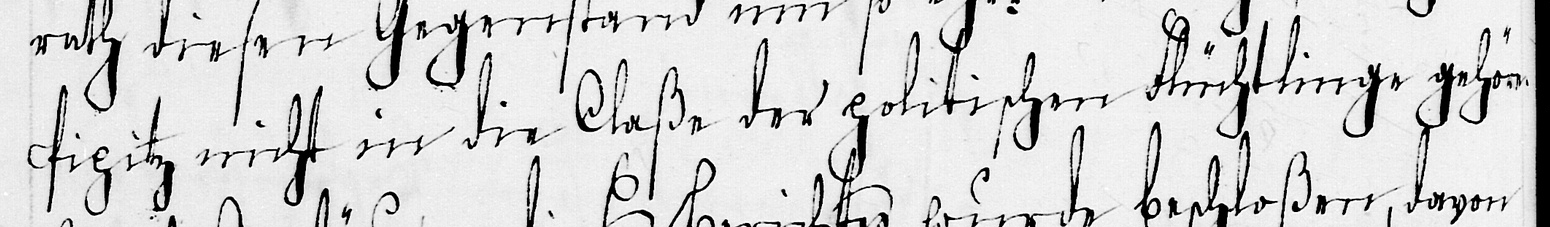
Pipitz nicht in die Claße der politischen Flüchtlinge gehör.
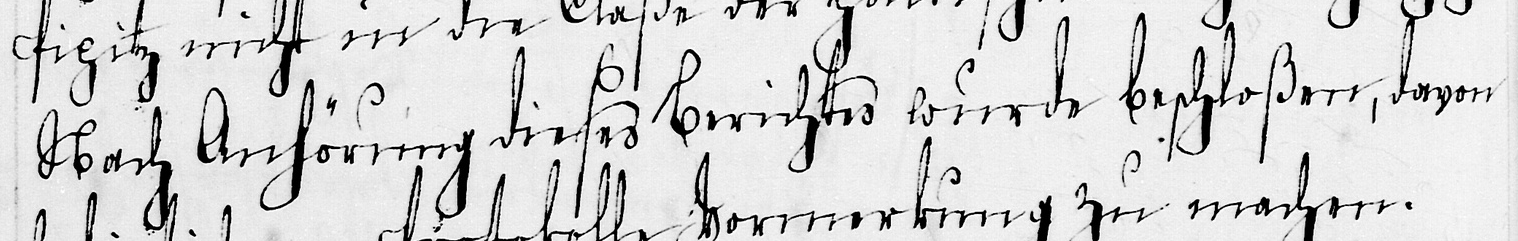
Nach Anhörung dieses Berichtes wurde beschloßen, davon
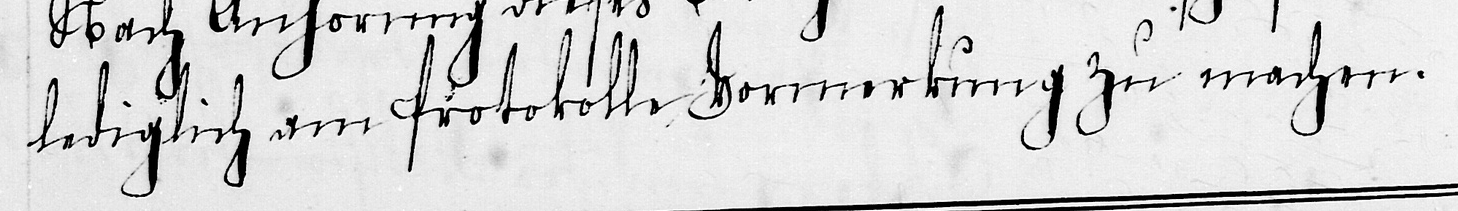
lediglich am Protokolle Vormerkung zu machen.
